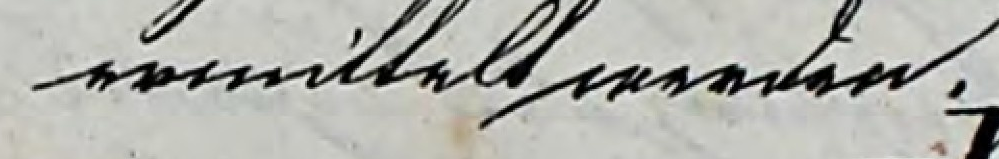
ermittel werden.
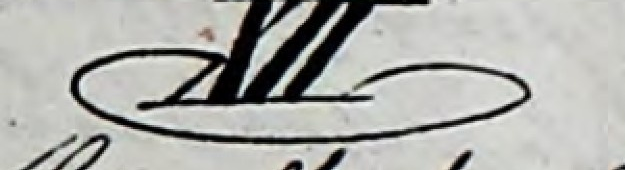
XII
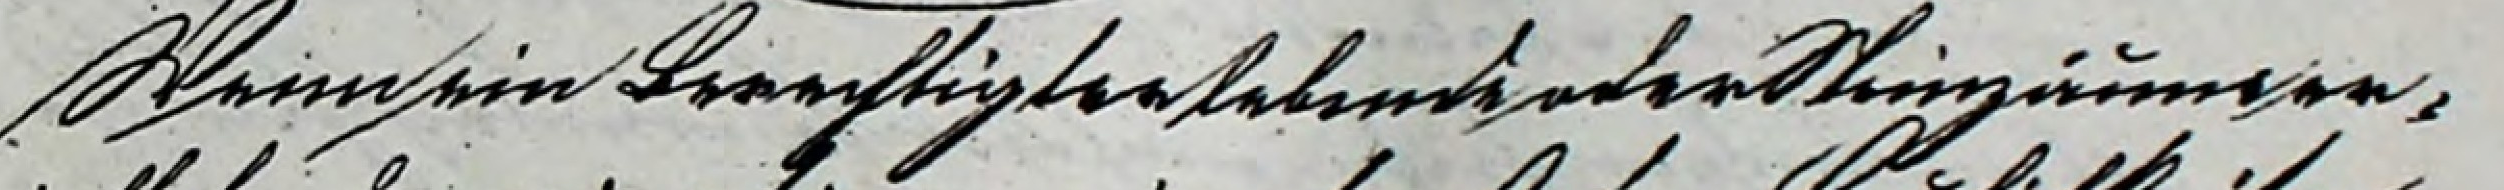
Wenn ein Berechtigten lebende oder Steinzäune er„
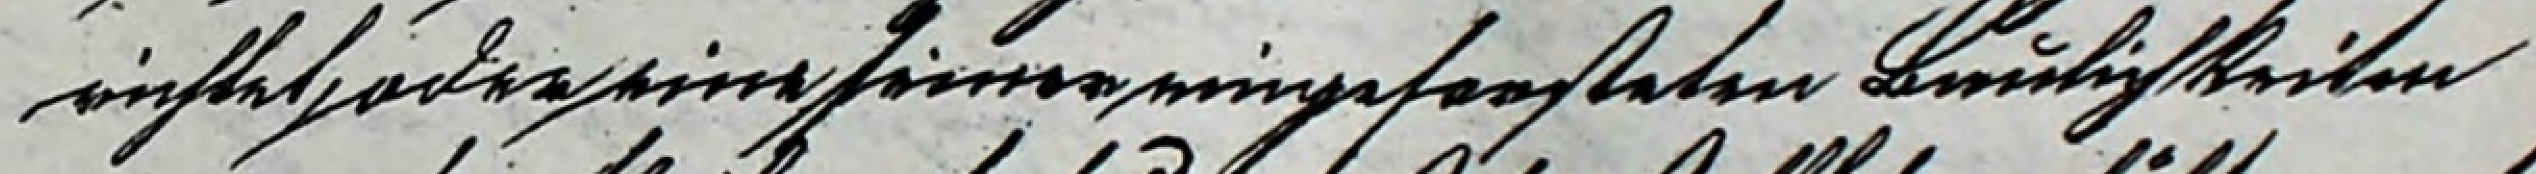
richtet, oder eine seiner eingeforsteten Baulichkeiten
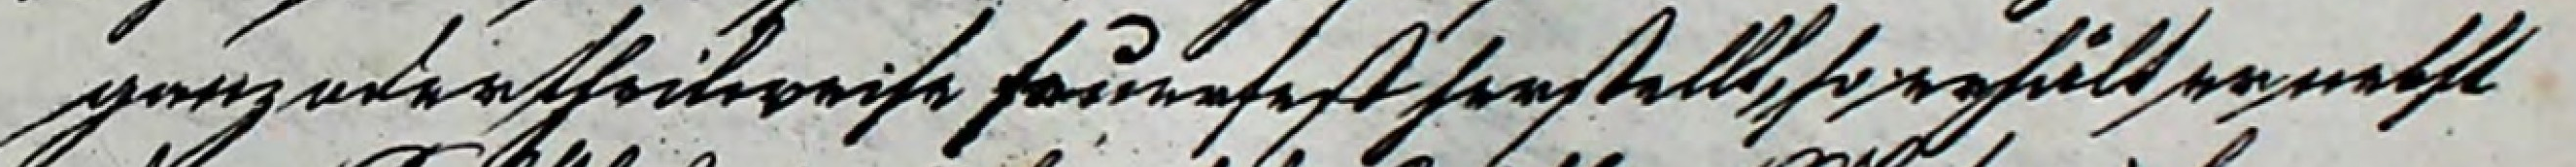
ganz oder theilweise feuerfest herstellt, so erhält er nebst
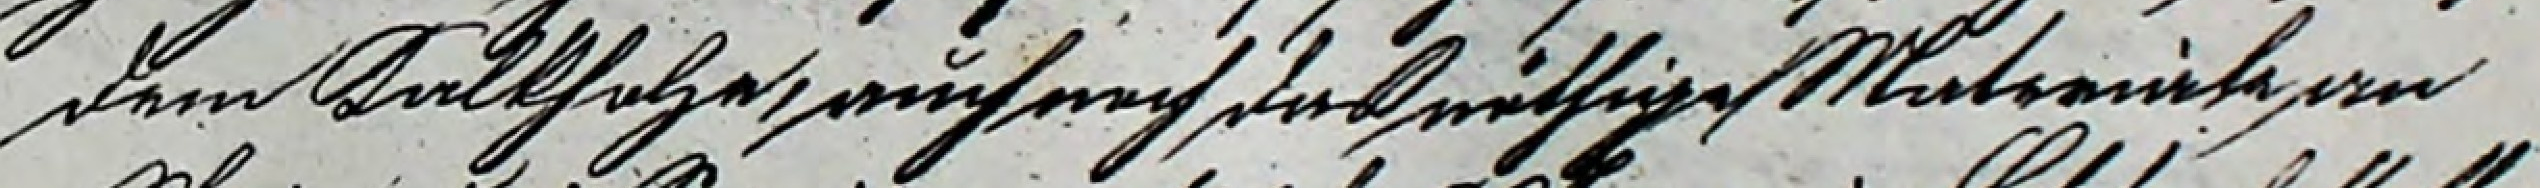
dem Kalkholze, auch nech das nöthige Materiale an
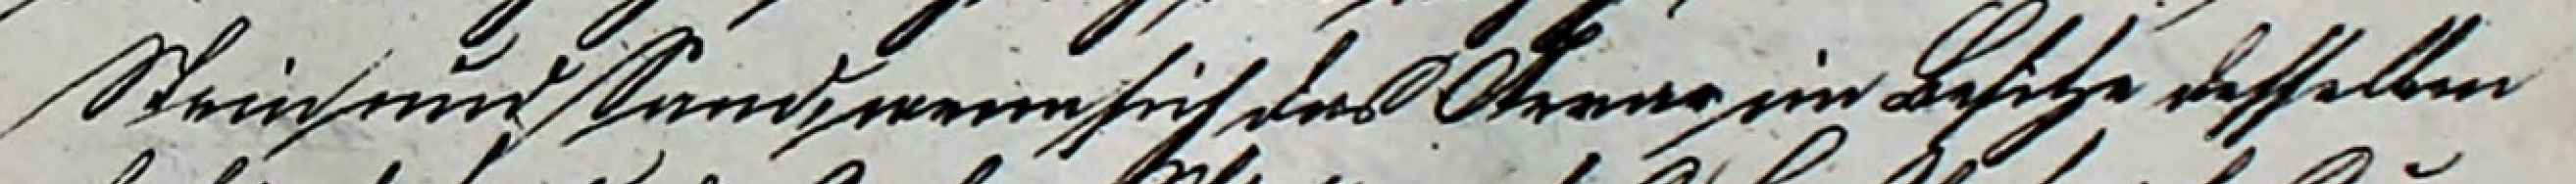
Stein und Sand, wenn sich das Aerar im Besitze desselben
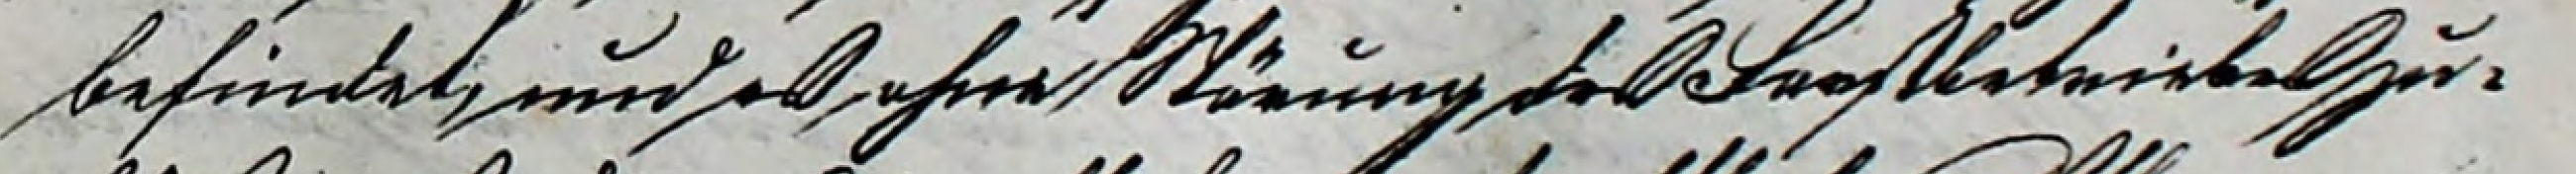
befindet, und es, ohne Störung des Forstbetriebes zu„
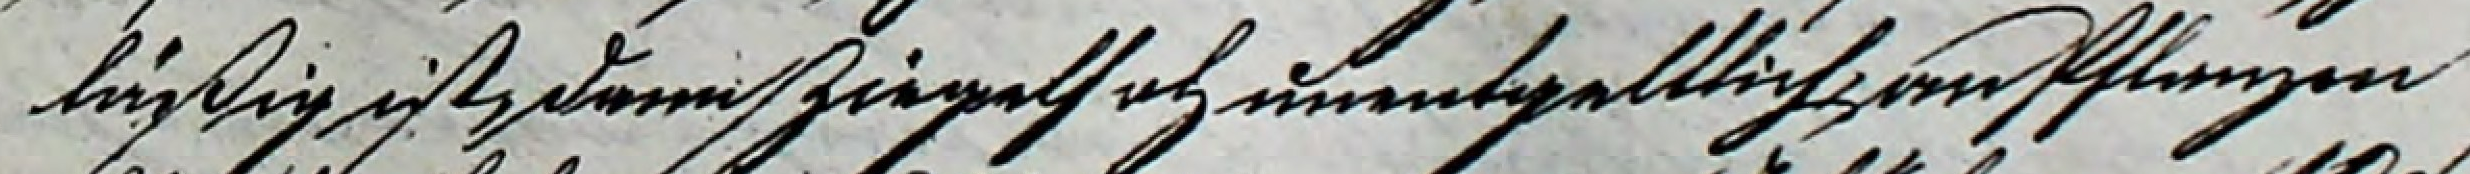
läßig ist, dann Ziegelholz unentgeltlich, an Pflanzen
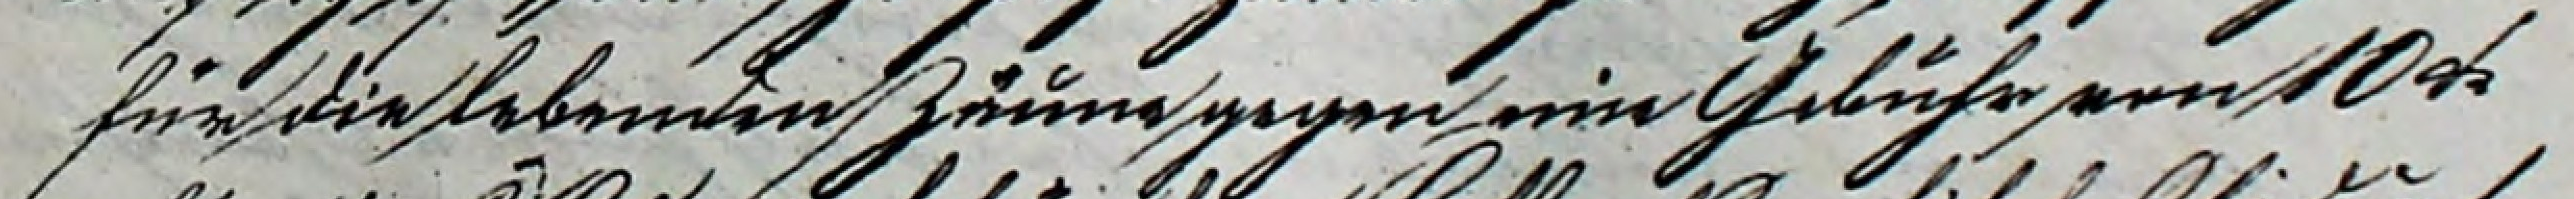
für die lebenden Zäune gegen eine Gebühr von 10 te
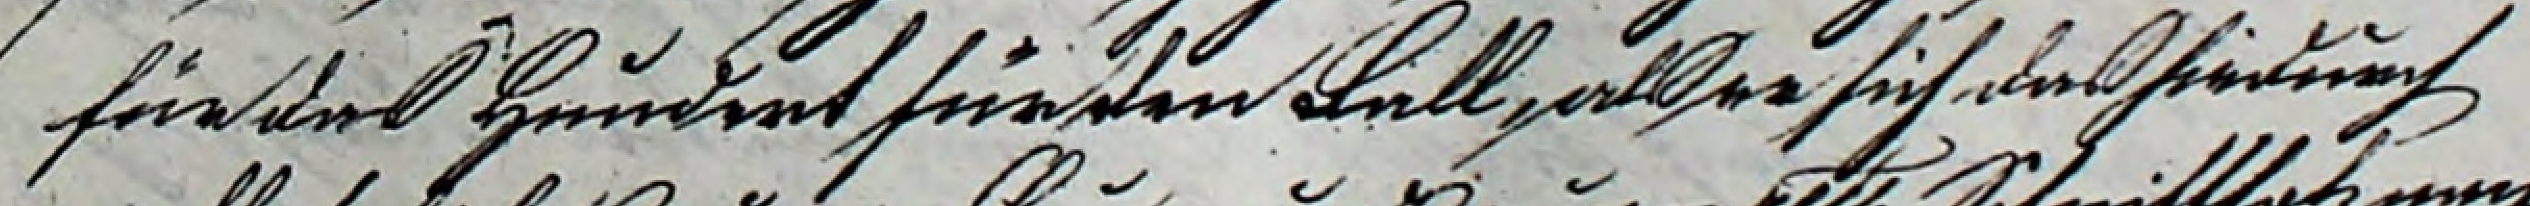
für das Hundert für den Fall, als er sich das hiedurch
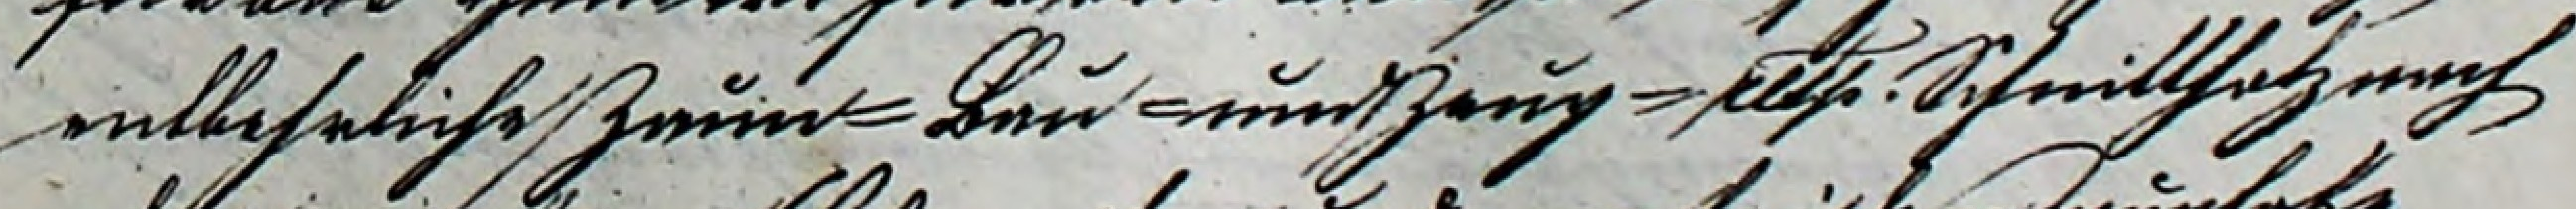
entbehrliche Zaun=Bau = und Zeug = resp. Schnittholz nach
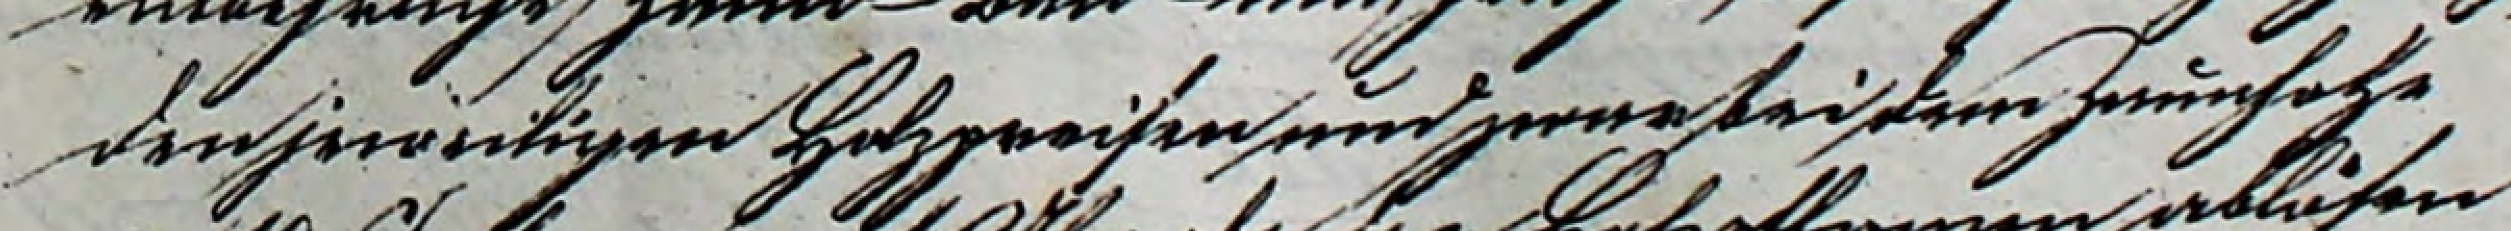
den jeweitigen Holzpreisen und zwar bei dem Zaunholze
